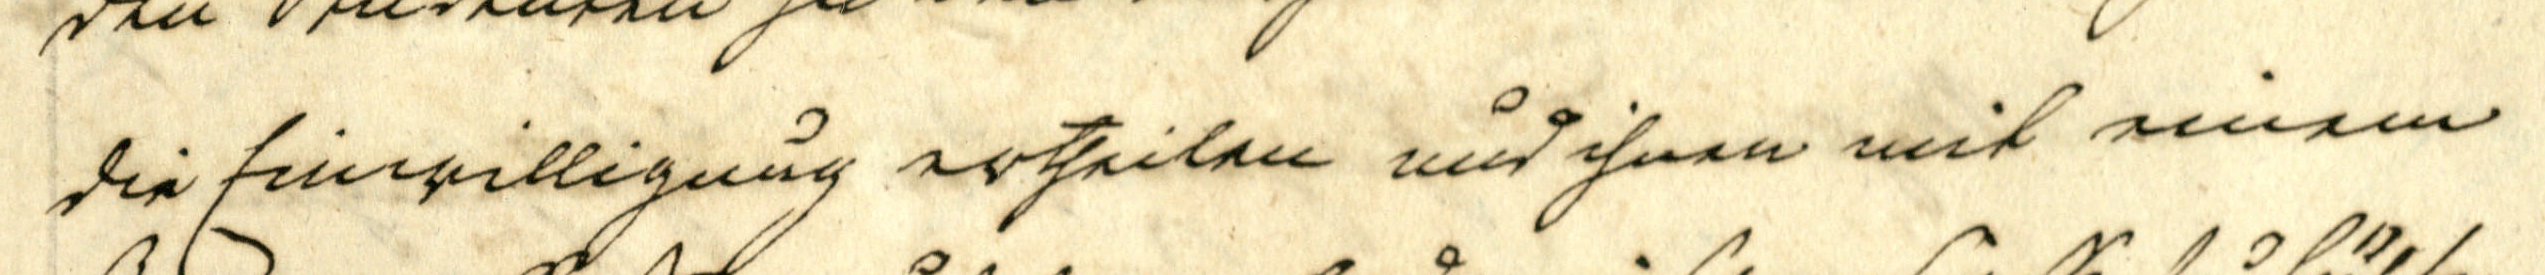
die Einwilligung ertheilen und ihnen mit einem
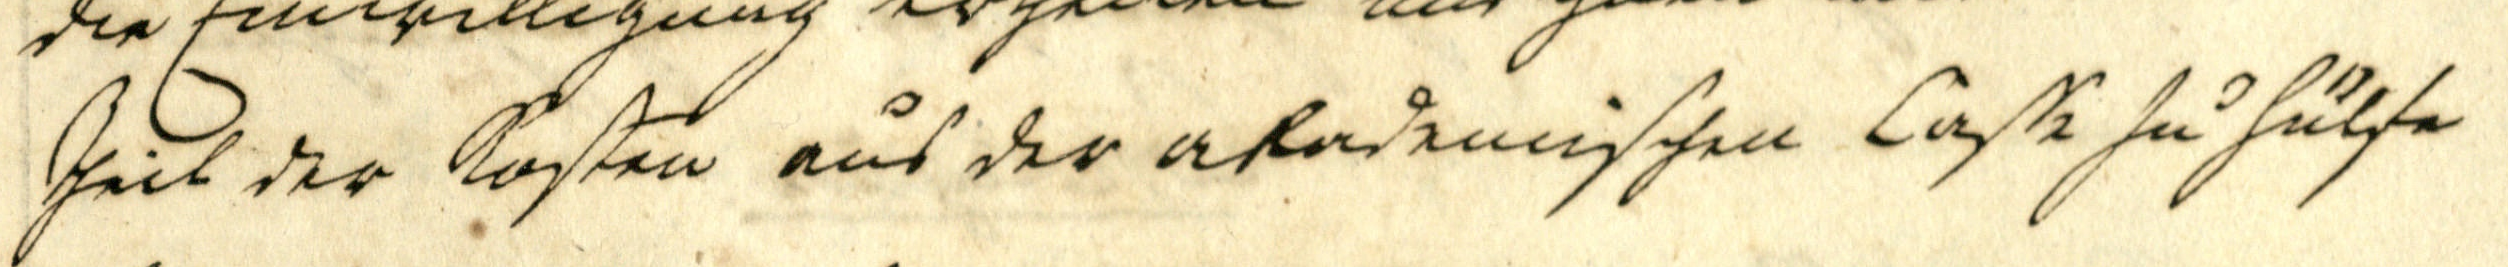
Theil der Kosten aus der akademischen Casse zu Hülf
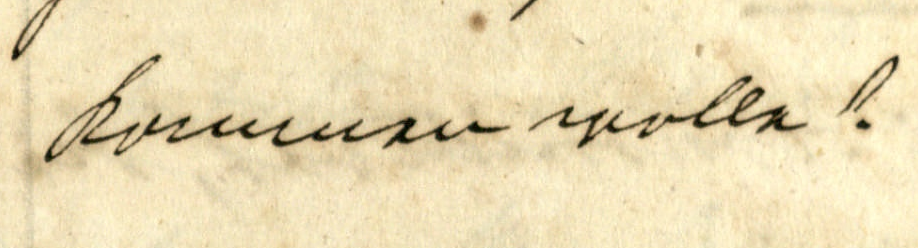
kommen wolle?
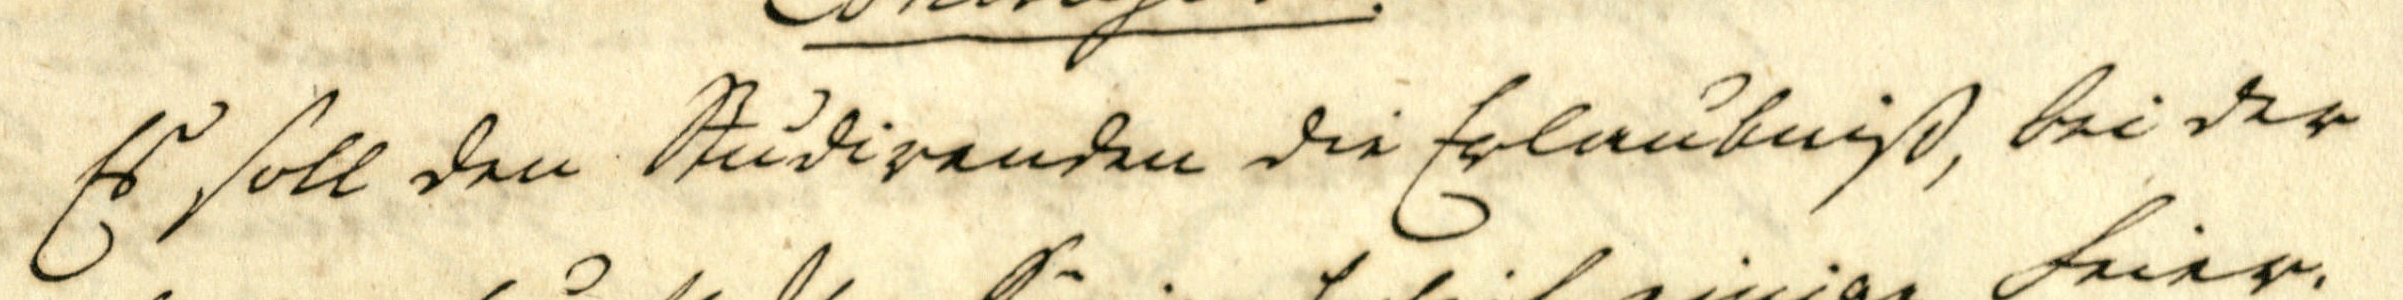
Es soll den Studirenden die Erlaubniß, bei der
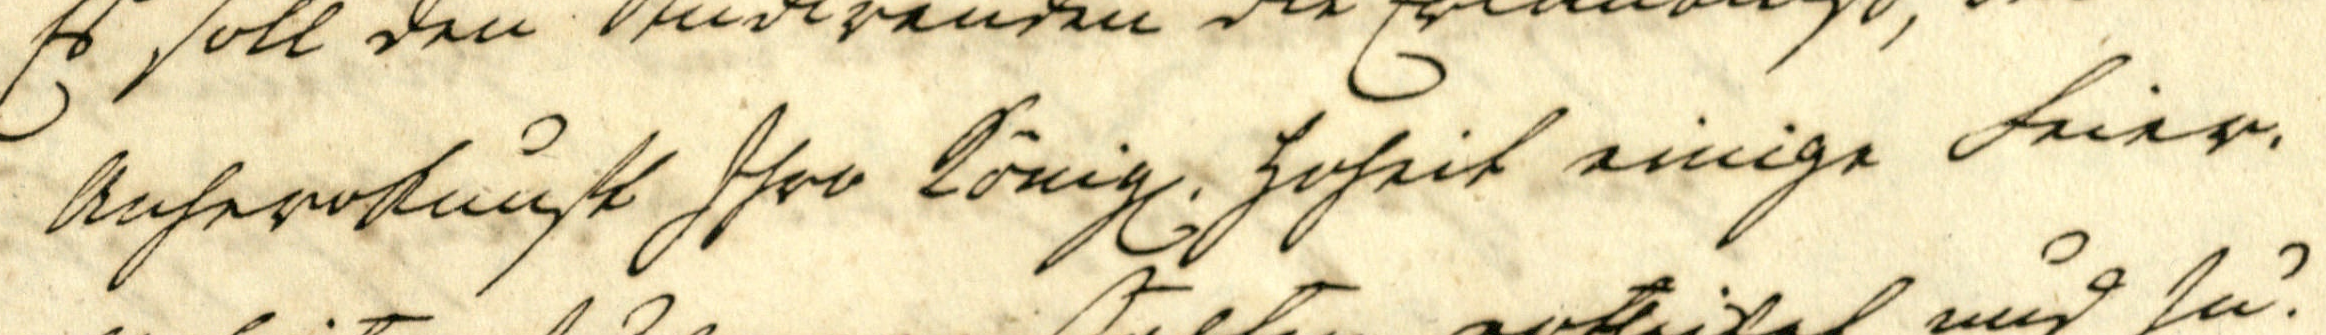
Anherokunft Ihrer Königl. Hoheit einige Feier¬
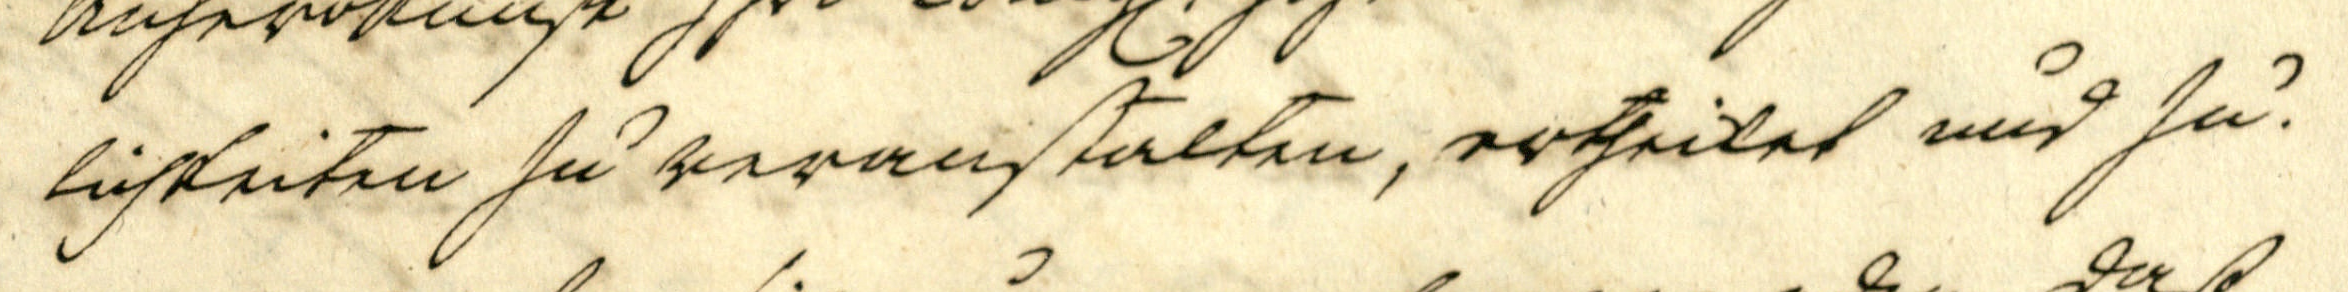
lichkeiten zu veranstalten, ertheilet und zu¬
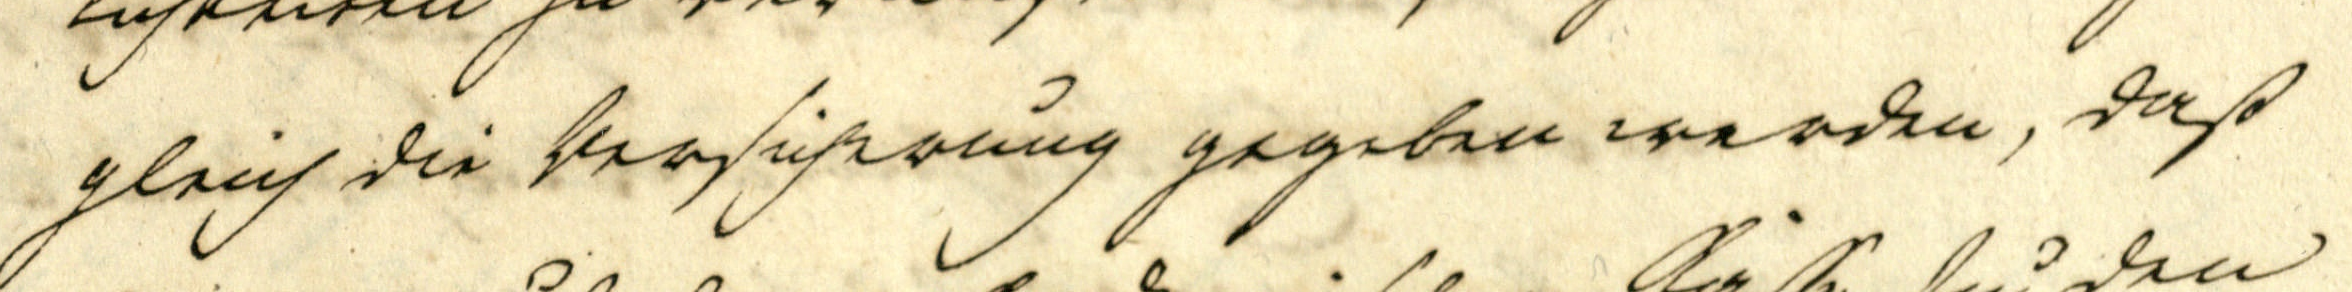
gleich die Versicherung gegeben werden, daß
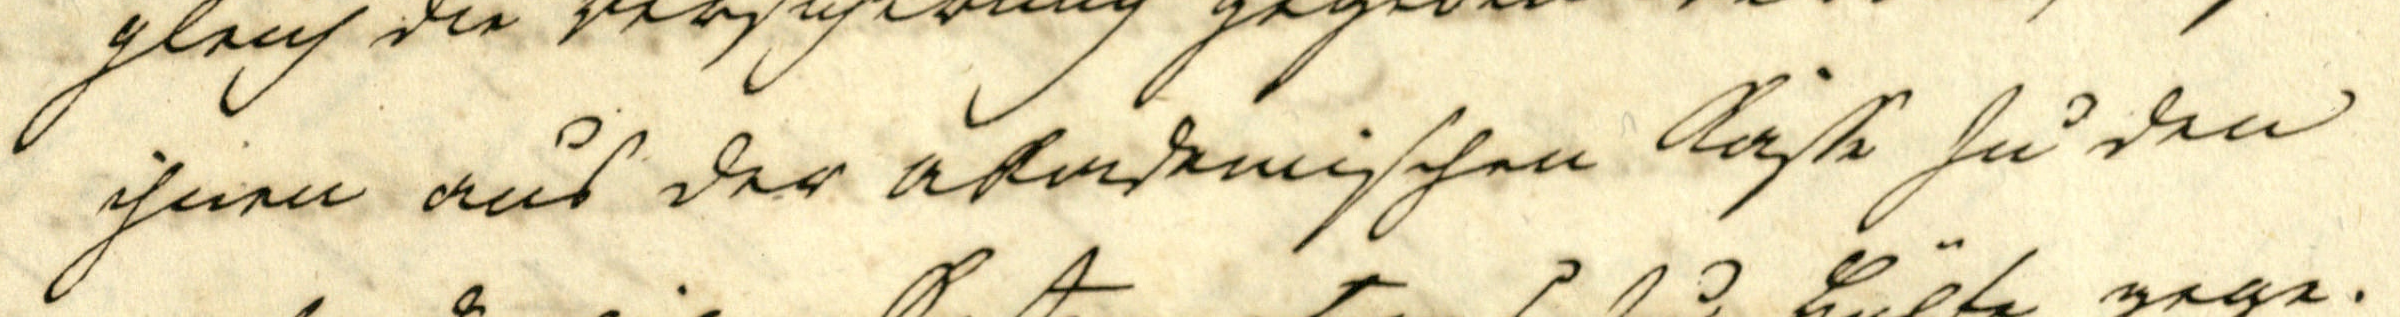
ihnen aus der akademischen Kasse zu den
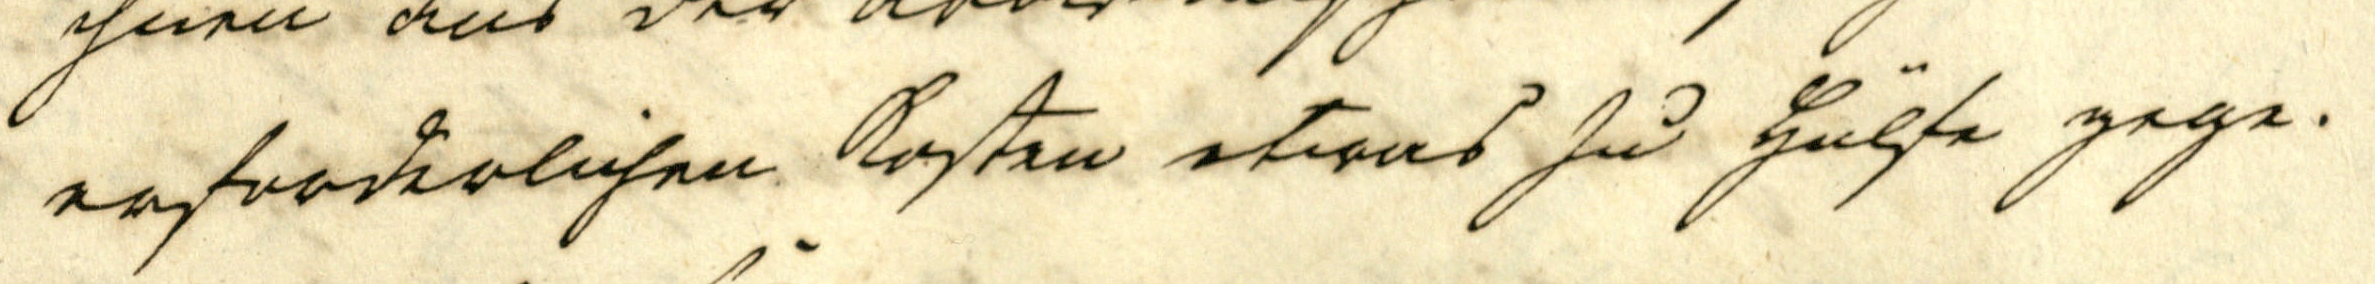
erforderlichen Kosten etwas zu Hülfe gege¬
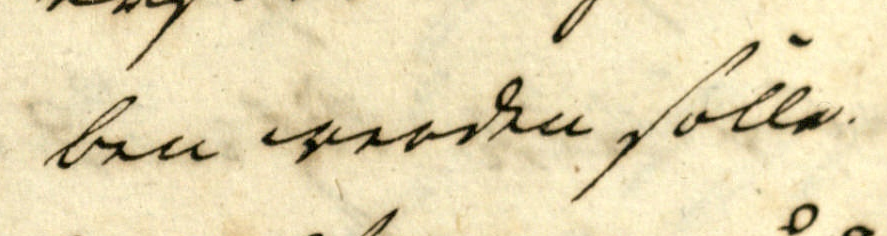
ben werden solle.
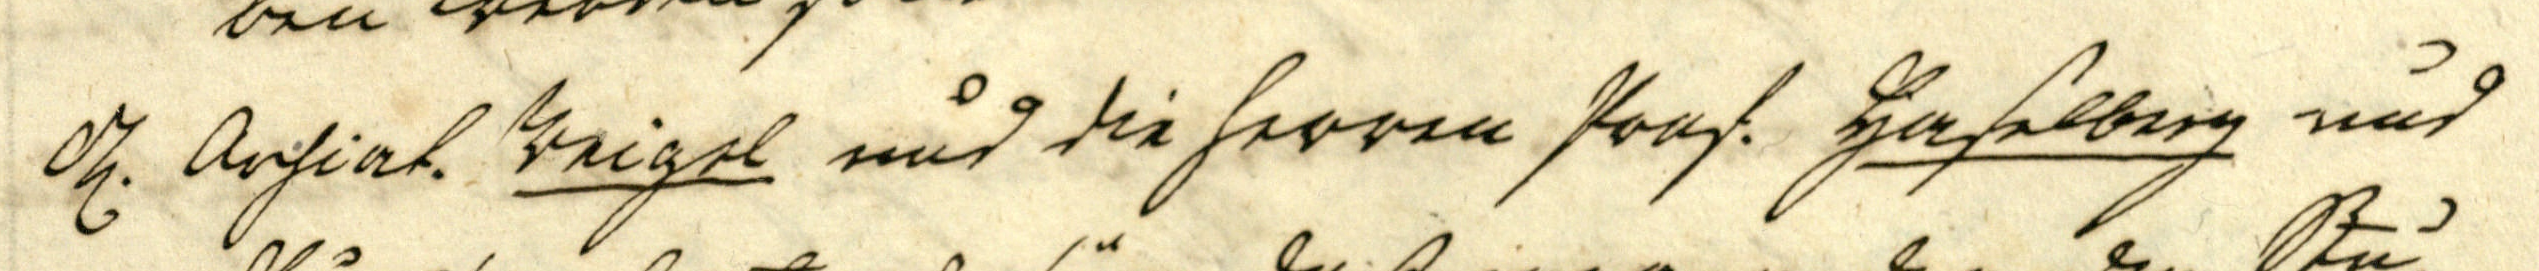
dh. Archiat. Weigel und die Herren Prof. Haselberg und
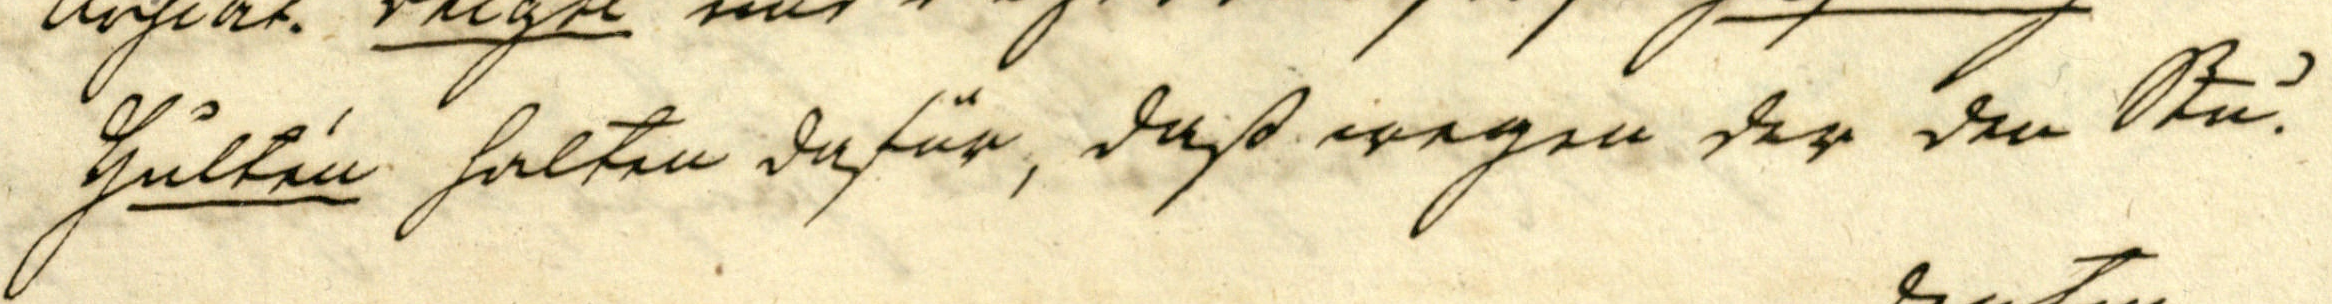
Hultén halten dafür, daß wegen der den Stu¬
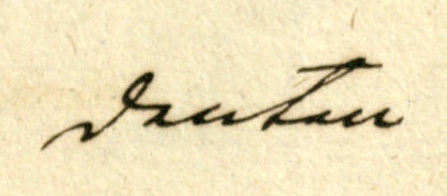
denten
